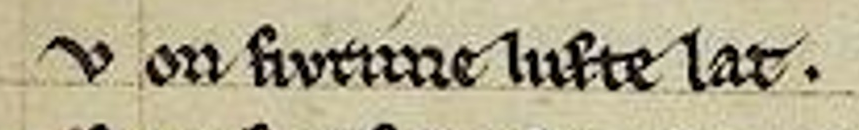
Von fivrime lufte lat.
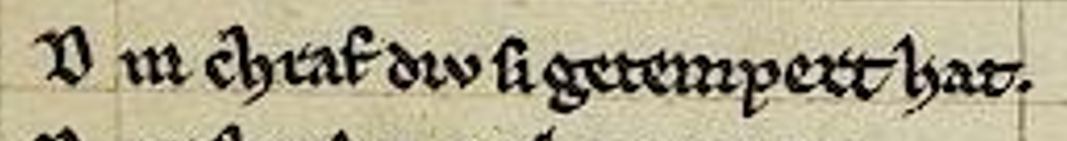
Din chraf div ſi getempert hat.
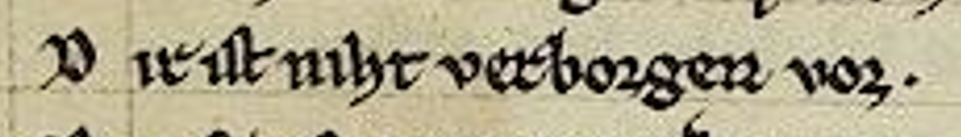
Dir iſt niht verborgen vor.
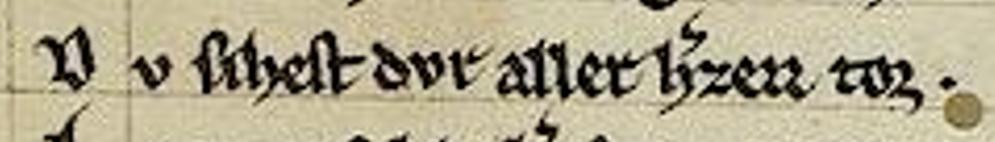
Dv ſiheſt dvr aller h(er)zen tor.
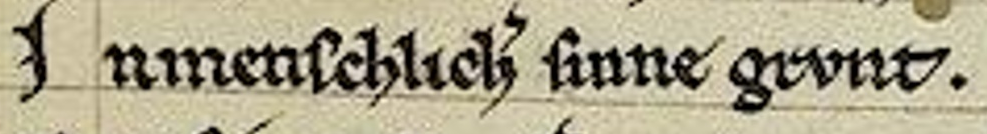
Inmenſchlich(er) ſinne grvnt.
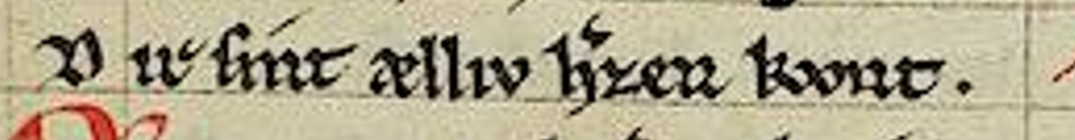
Dir ſint [ae]lliv h(er)zen kvnt.
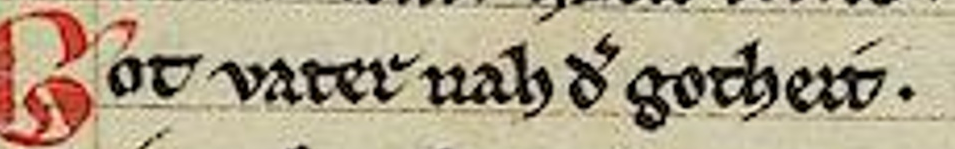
*Got vater nah d(er) gotheit.
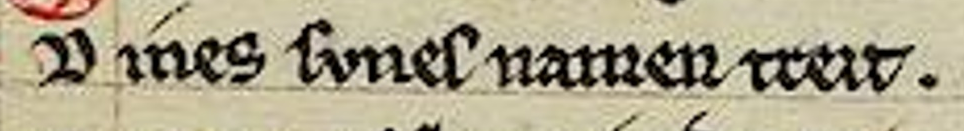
Dines ſuneſ namen treit.
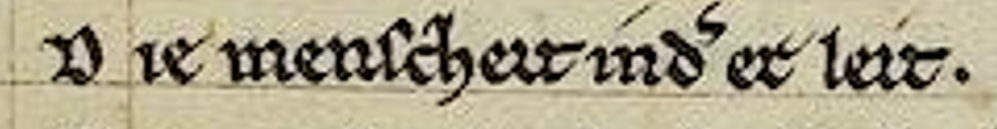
Die menſcheit ind(er) er leit.
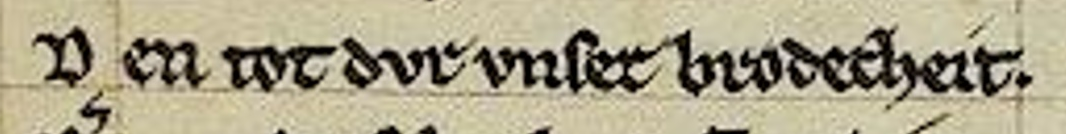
Den tot dvr vnſer brodecheit.
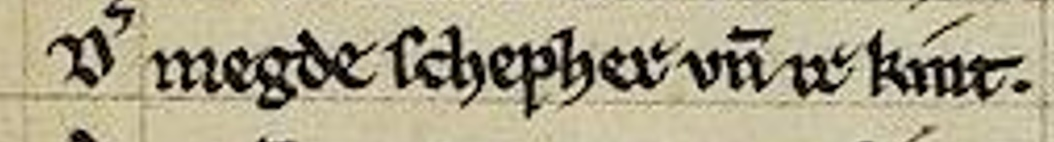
D(er) megde ſchepher vn(d) ir kint.
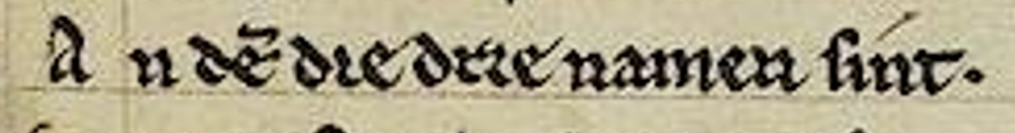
An de(m) die drie namen ſint.
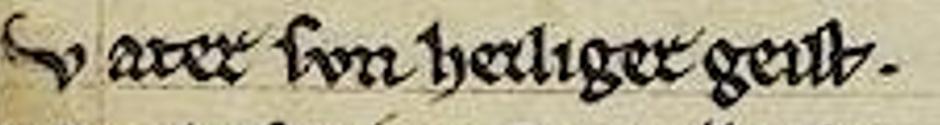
Vater ſvn heiliger geiſt.
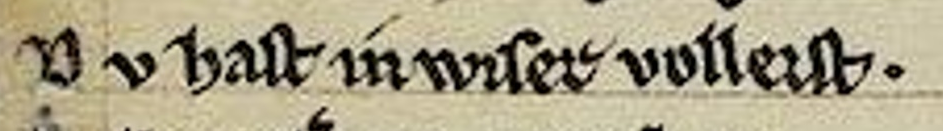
Dv haſt in wiſer volleiſt.
